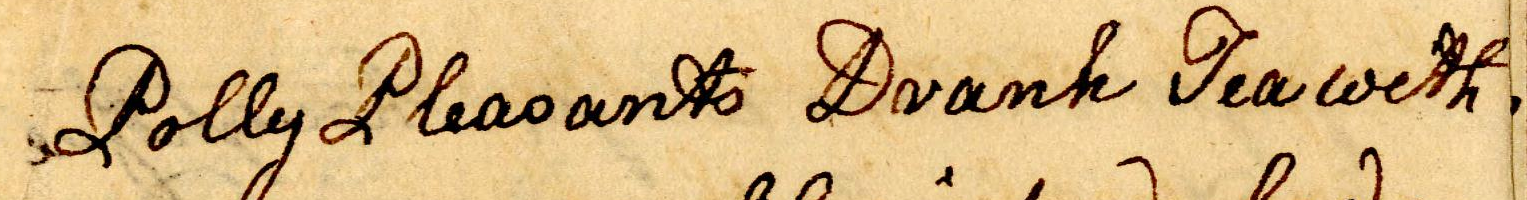Polly Pleasants Drank Tea with
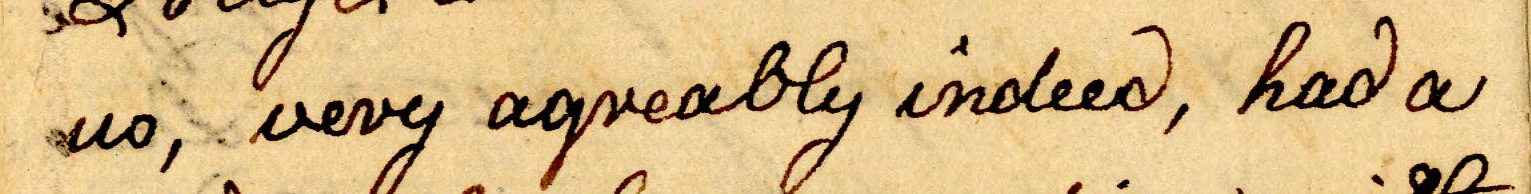us, very agreably indeed, had a
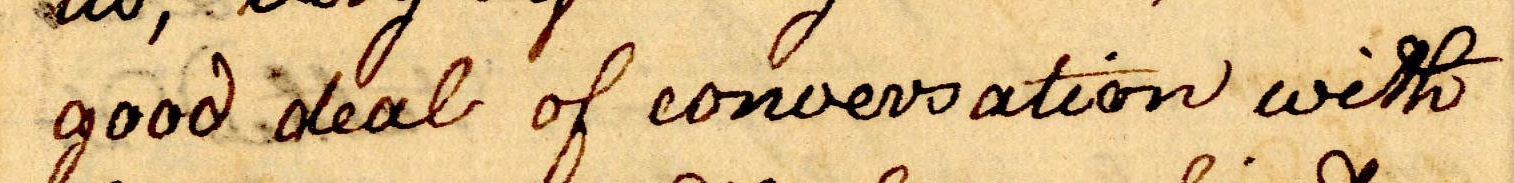good deal of conversation with
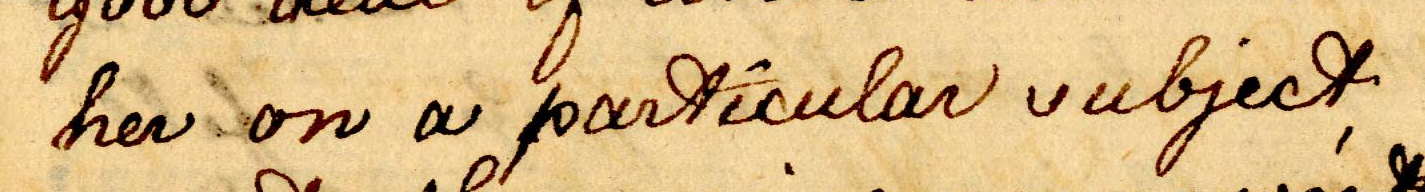her on a particular subject,
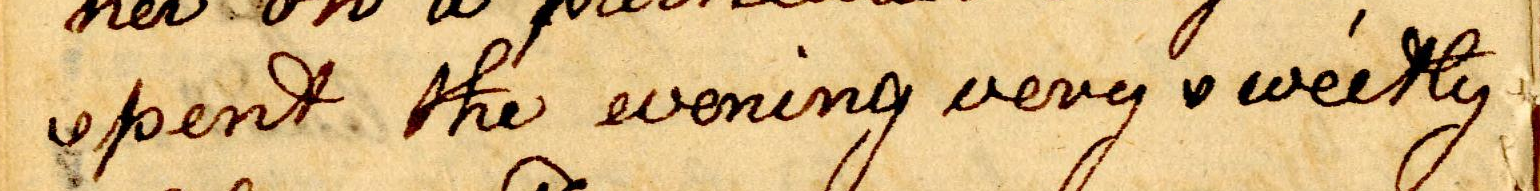spent the evening very sweetly
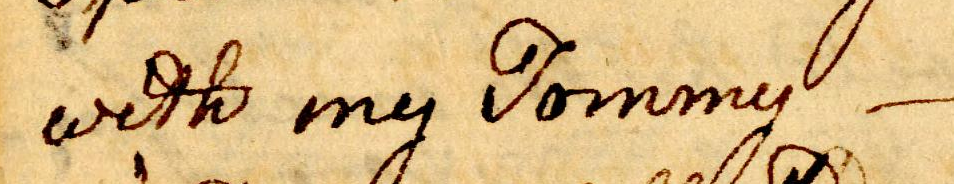with my Tommy-
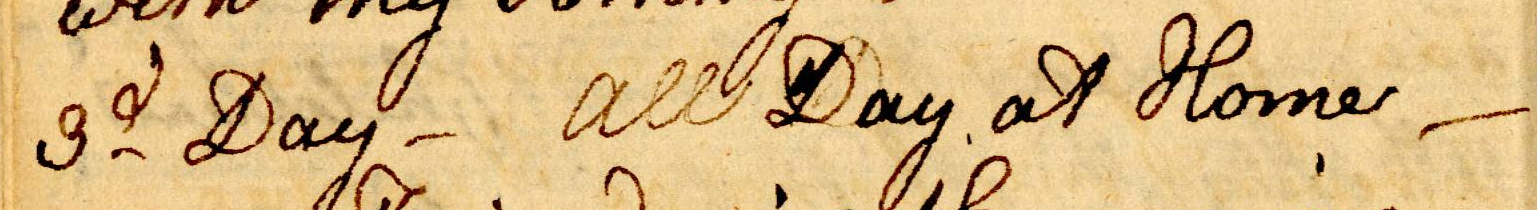3^d. Day- All Day at Home-
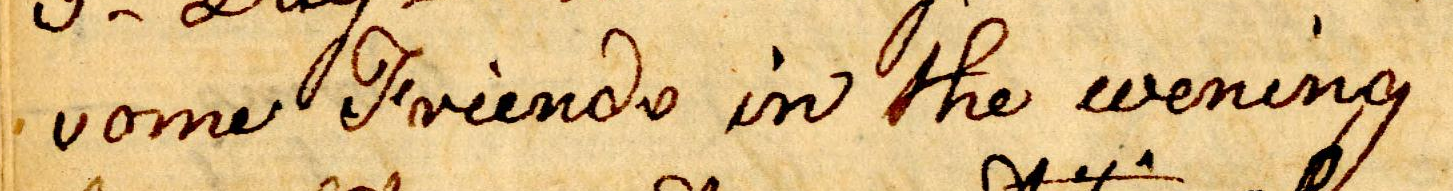some Friends in the evening
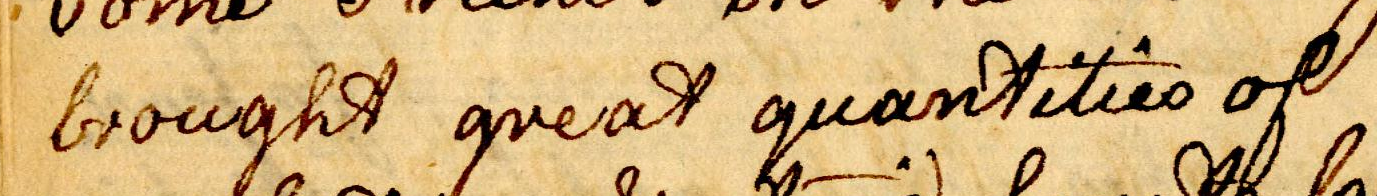brought great quantities of
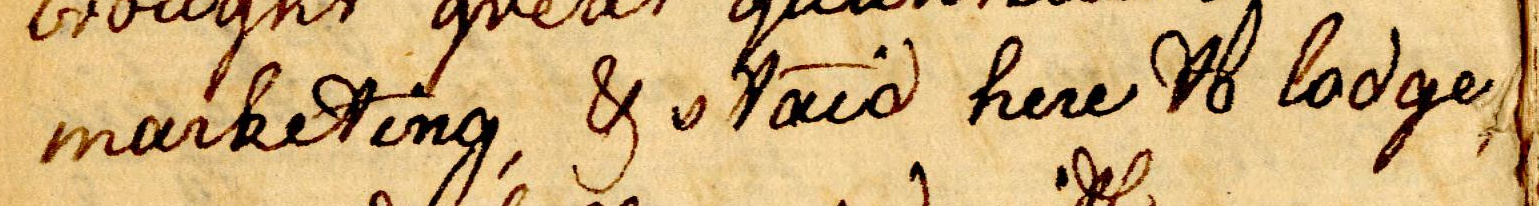marketing, & staid here to lodge
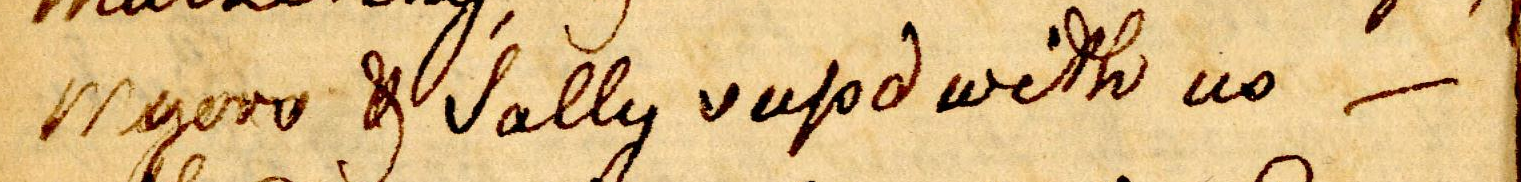Myers & Sally supd with us-
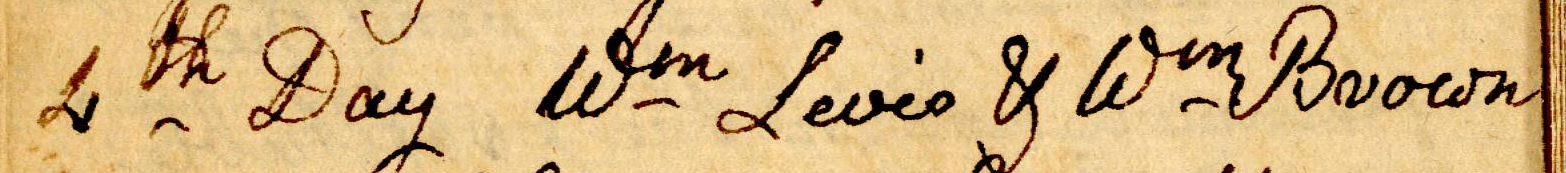4^th Day W^m Levis & W^m Brown
